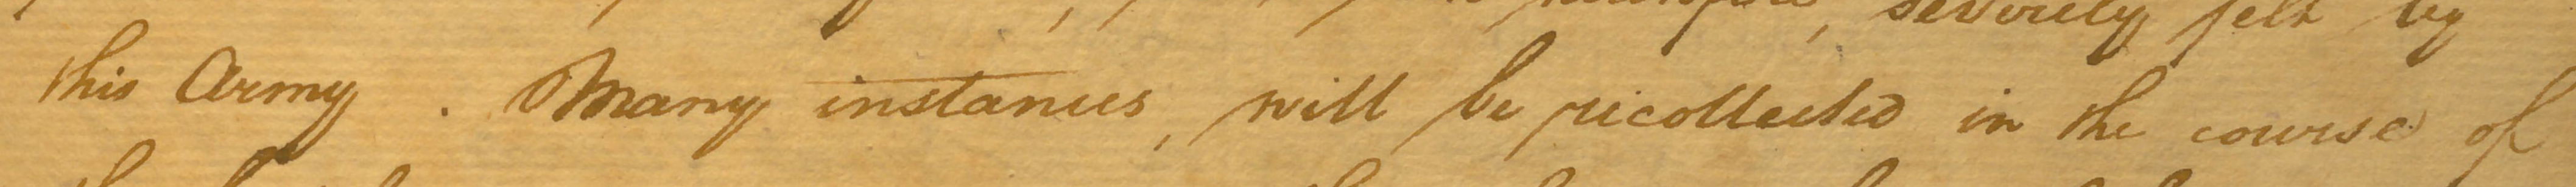this Army. Many instances, will be recollected in the course of
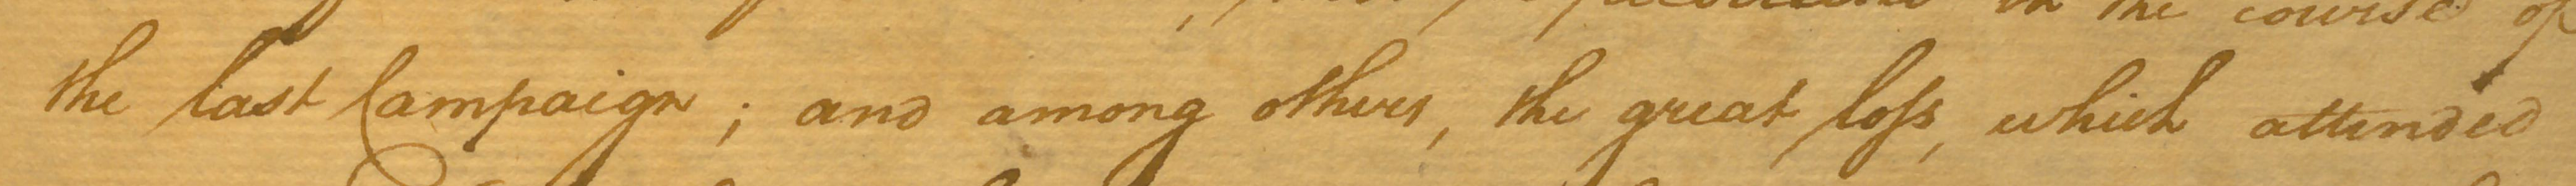the last Campaign; and among others, the great loss which attended
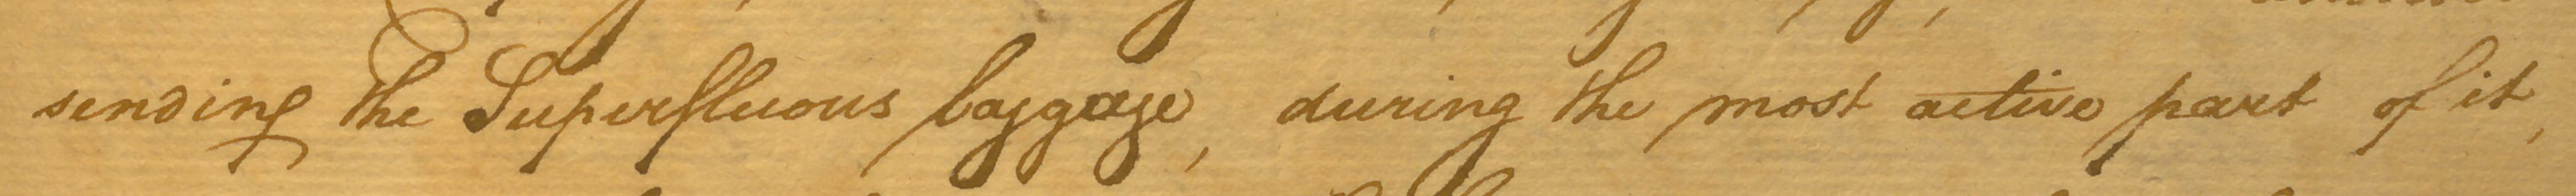sending the Superfluous baggage, during the most active part of it
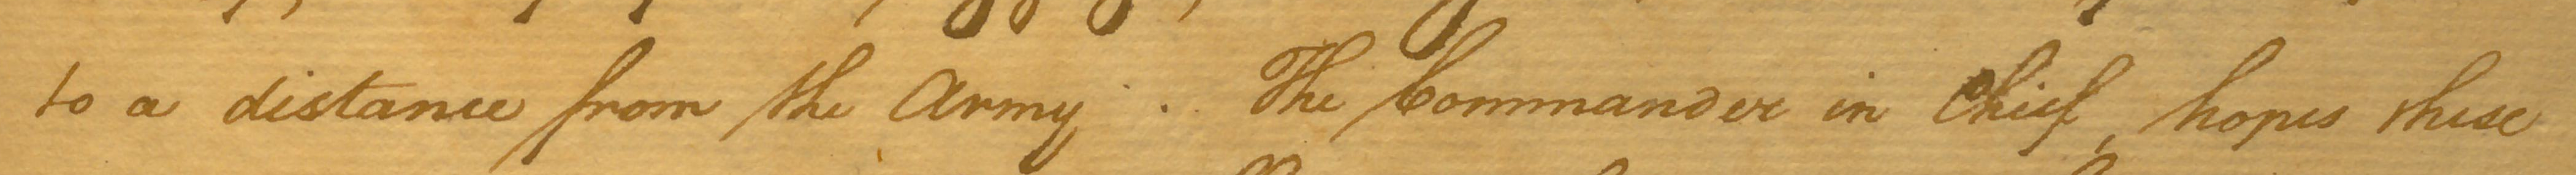to a distance from the Army. The Commander in Chief hopes these
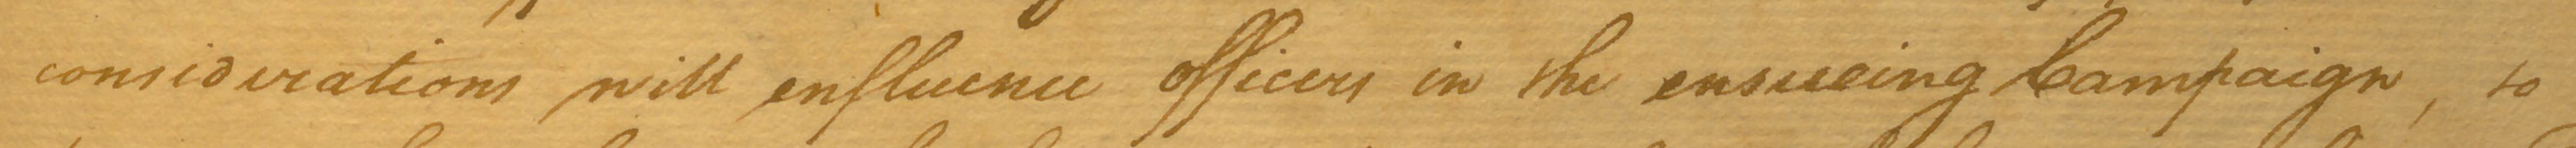considerations will influence officers in the ensuing Campaign, to
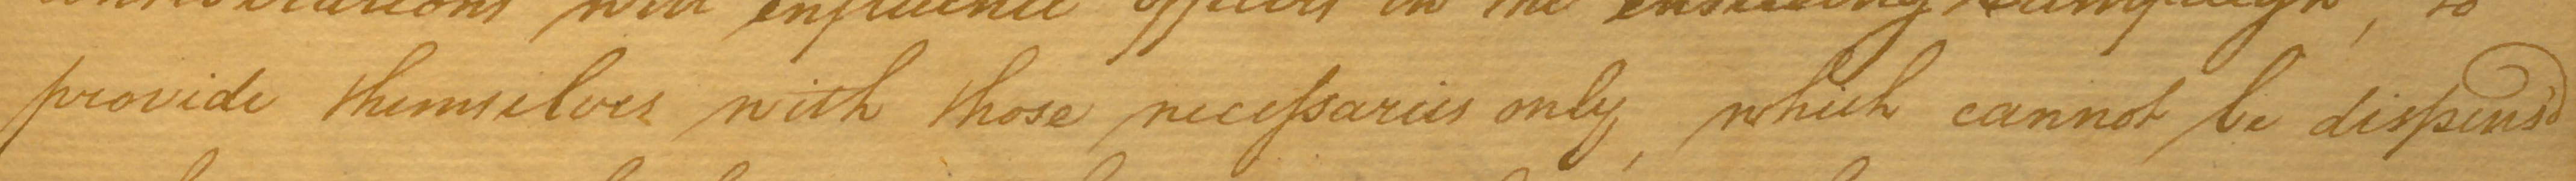provide themselves with these necessaries only, which cannot be dispens'd
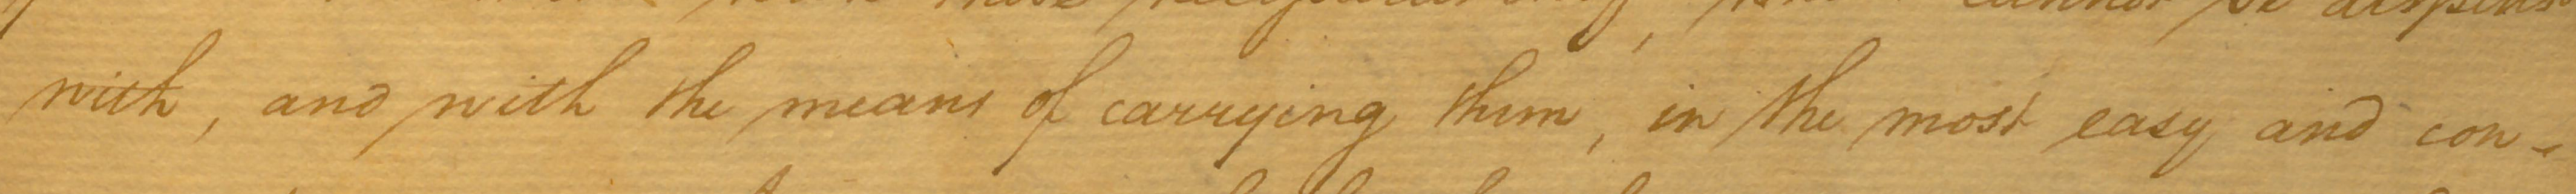with, and with the means of carrying them, in the most easy and con-
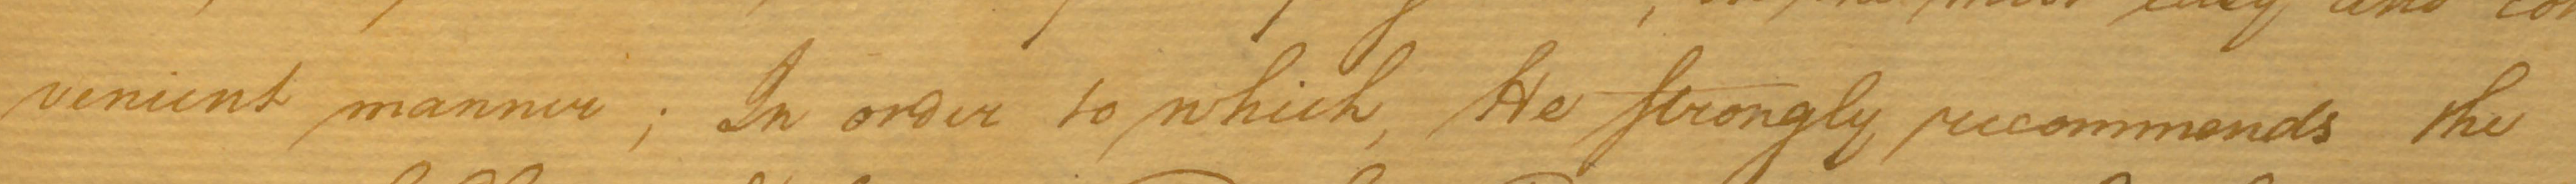venient manner; In order to which He strongly recommends the
